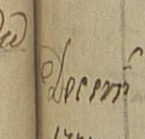Decem^r
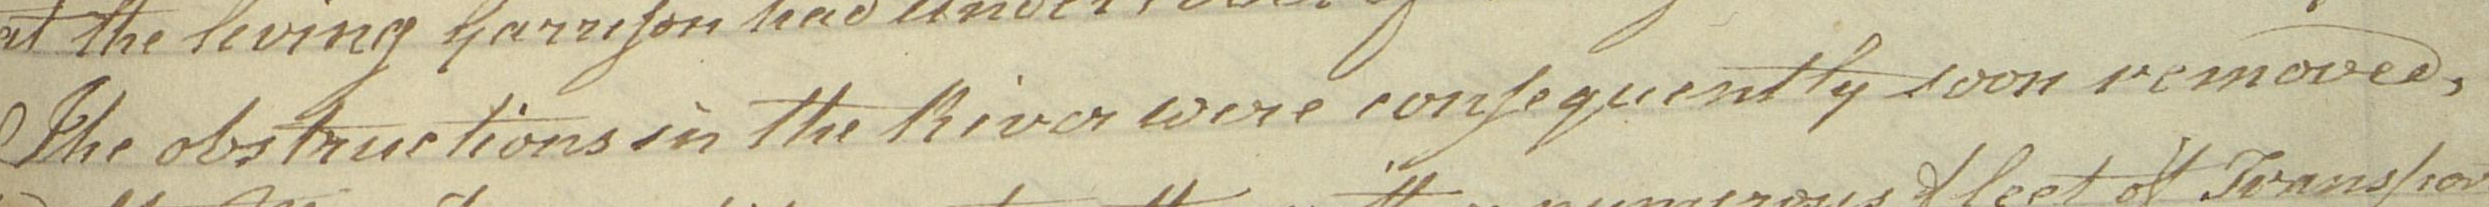The obstructions in the River were consequently soon removed,
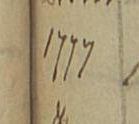1777
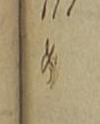&
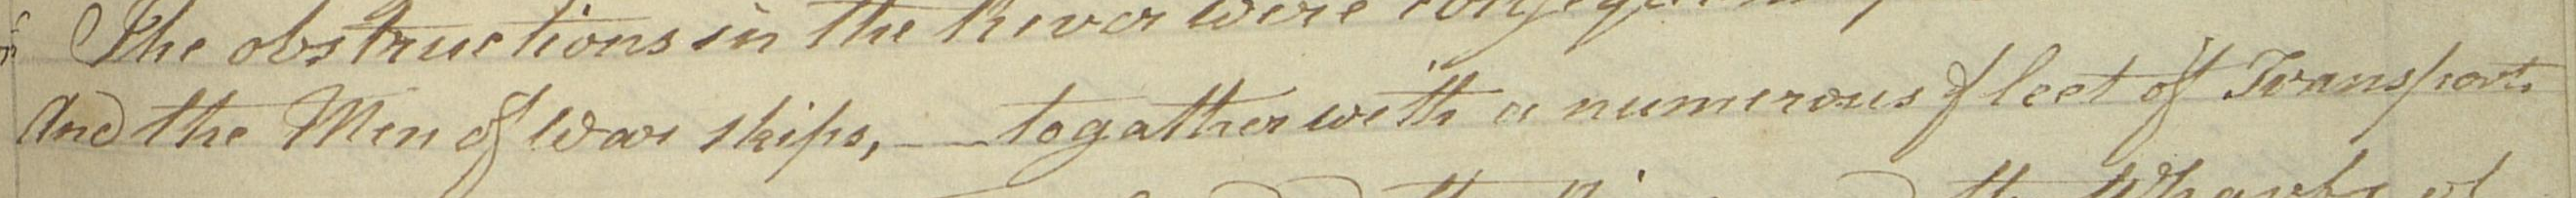and the Men of War ships, togather with a numerous fleet of Transport.
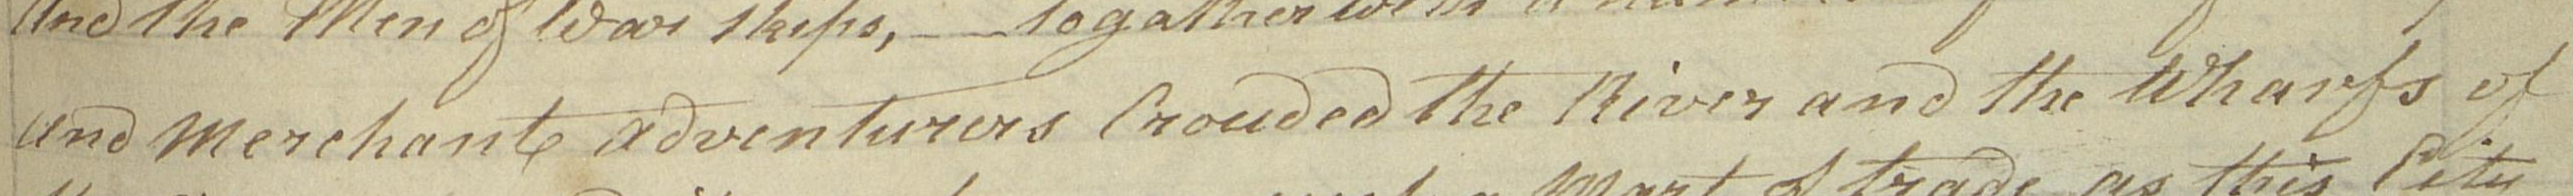and merchant adventurers Crouded the River and the Wharfs of
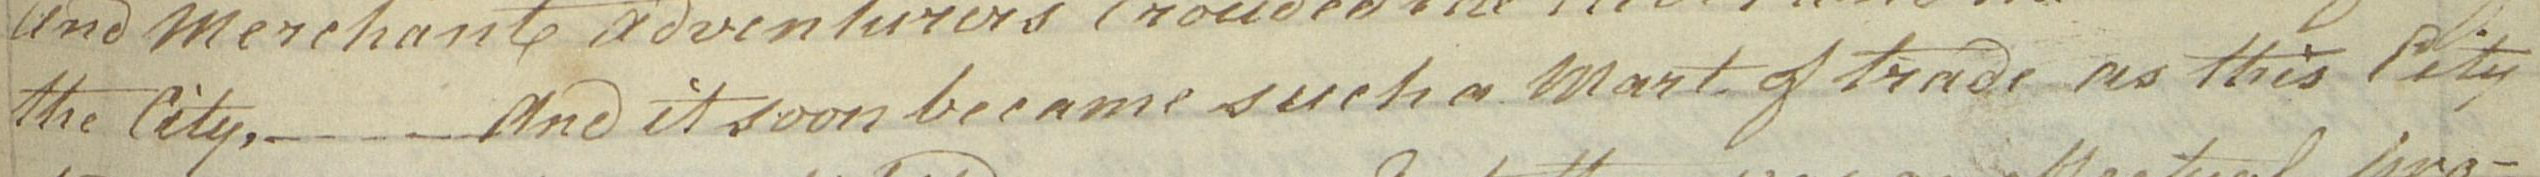the City. And it soon became such a Mart of trade as this City
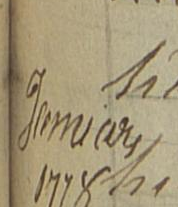January
